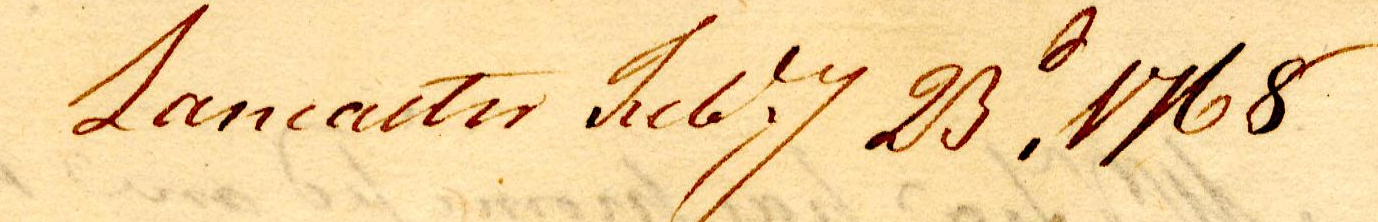Lancaster Feb^y 23^d. 1768
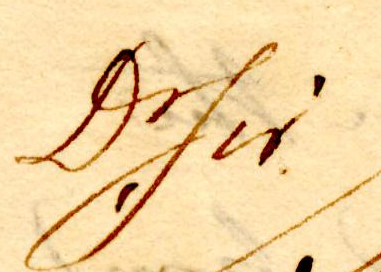D^r Sir
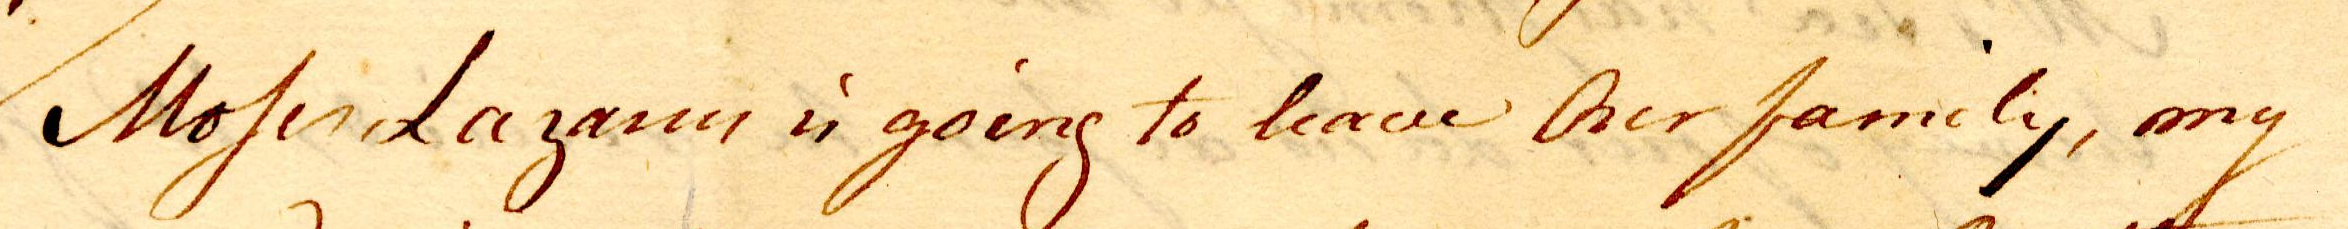Moses Lazarus is going to leave her family, my
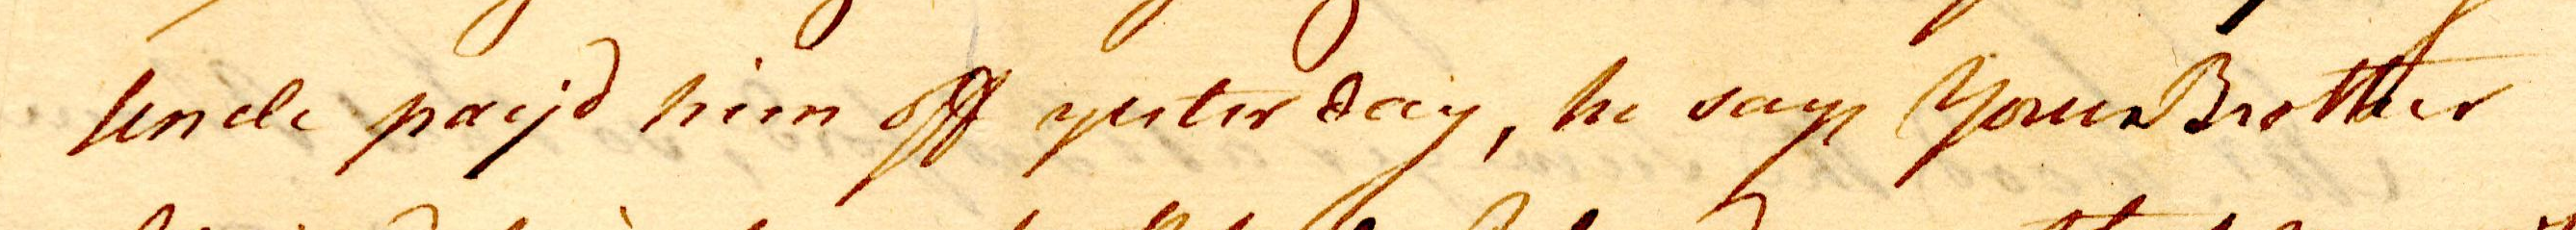uncle pay'd him off yesterday, he says your Brother
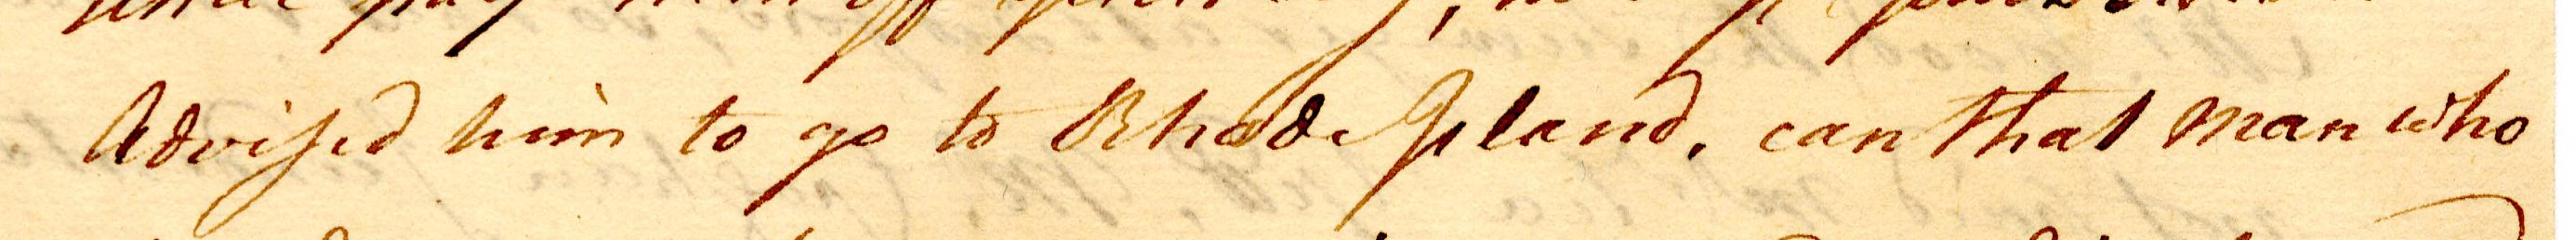Advised him to go to Rhode Island, can that man who
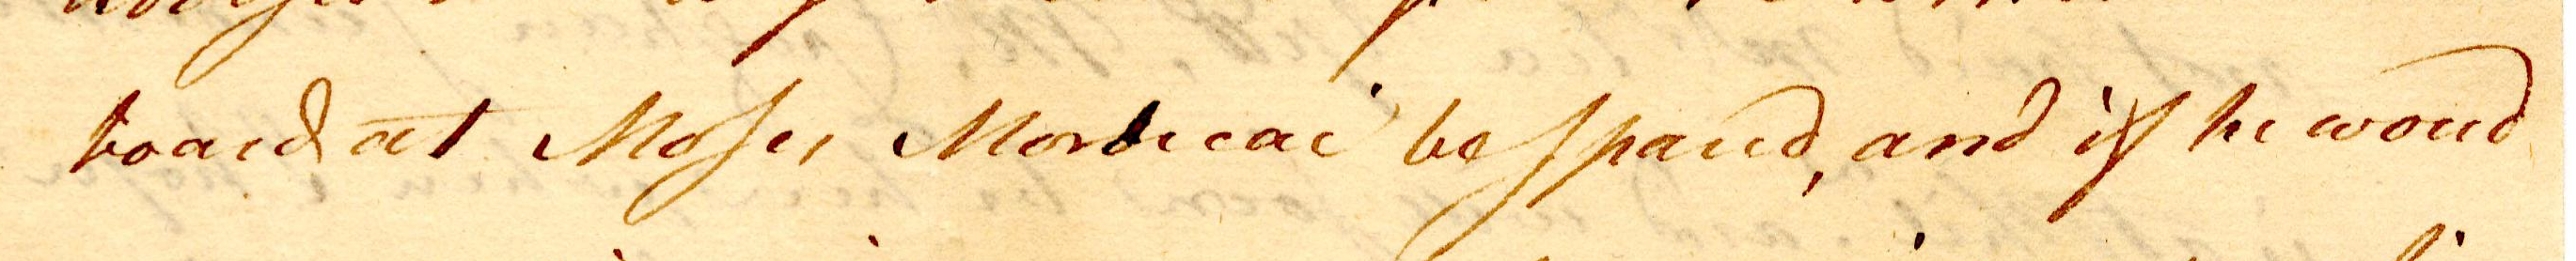board at Moses Mordecai be spared and if he woud
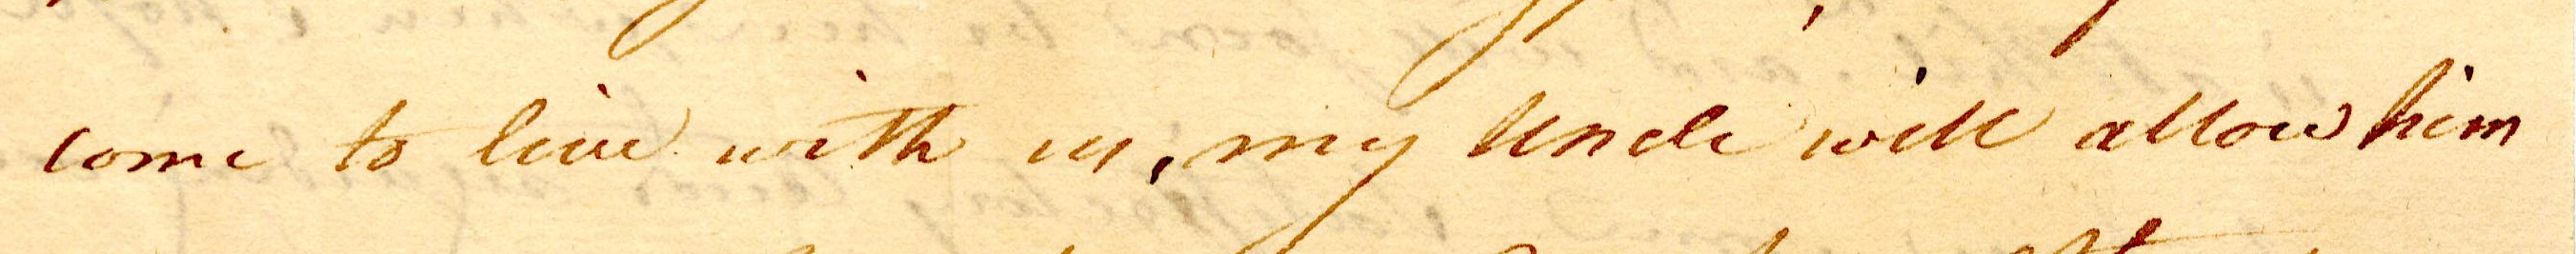come to live with us, my Uncle will allow him
